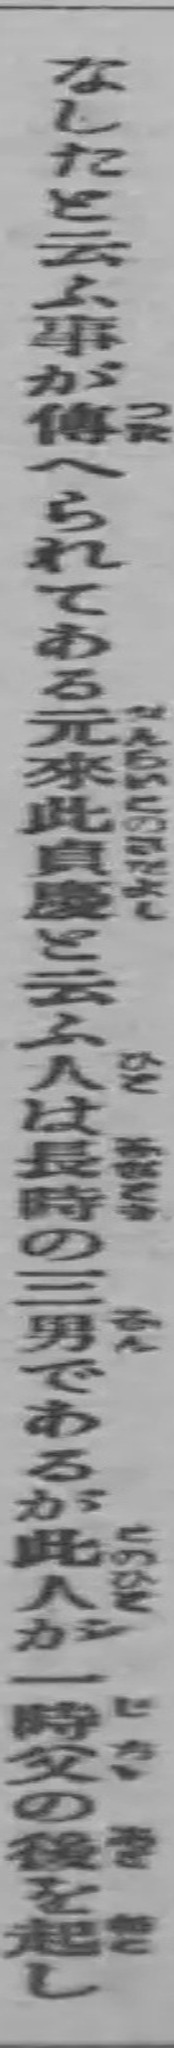なしたと云ふ事が伝へられてある元来此貞慶と云ふ人は長時の三男であるが此人が一時父の後を起し
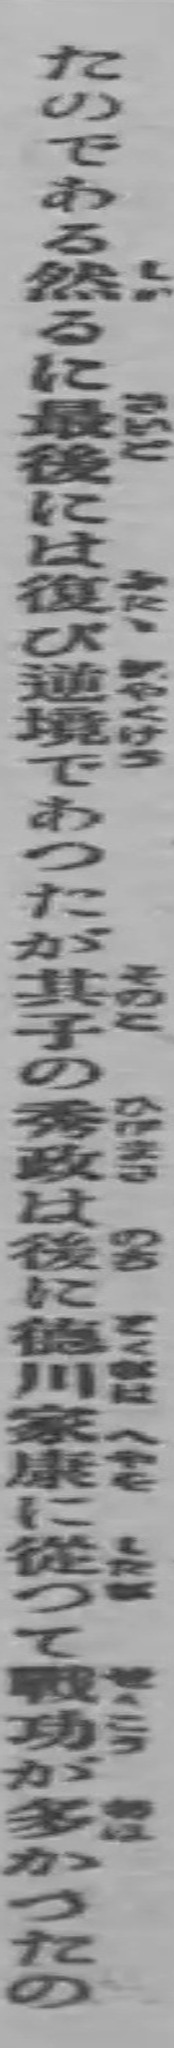たのである然るに最後には復び逆境であつたが其子の秀政は後に徳川家康に従つて戦功が多かつたの
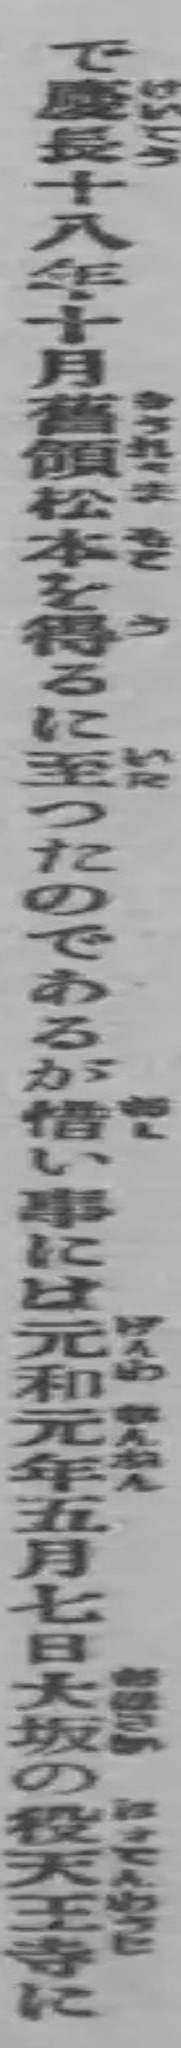で慶長十八年十月旧領松本を得るに至つたのであるが惜い事には元和元年五月七日大坂の役天王寺に
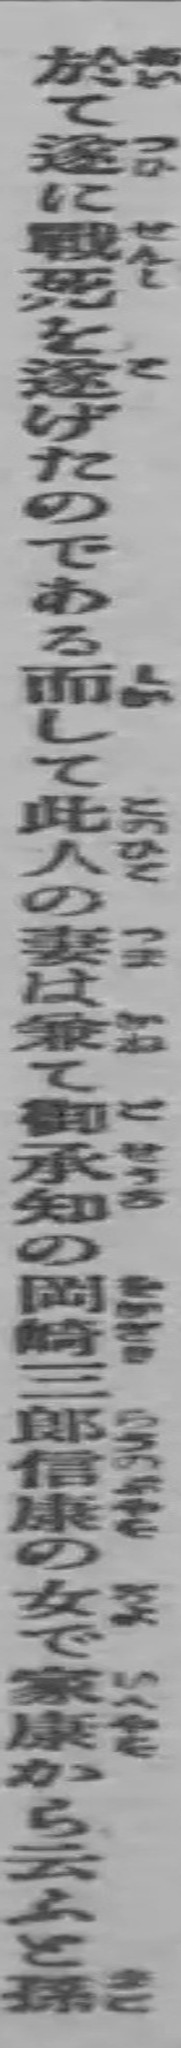於て遂に戦死を遂げたのである而して此人の妻は兼て御承知の岡崎三郎信康の女で家康から云ふと孫
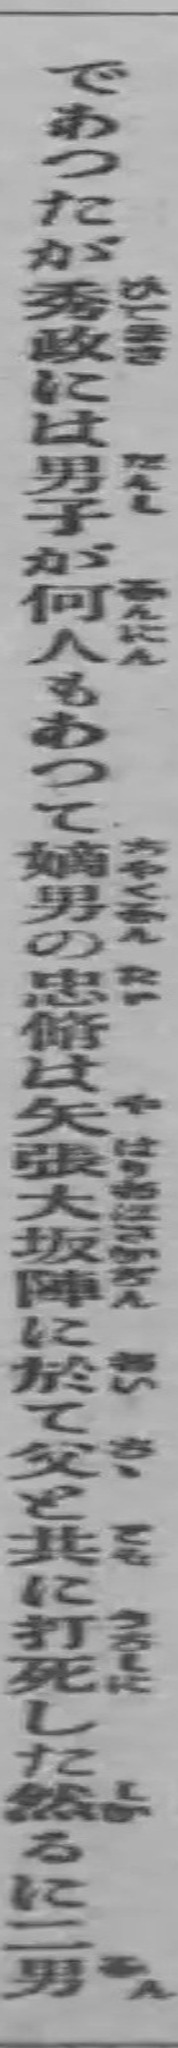であつたが秀政には男子が何人もあつて嫡男の忠脩は矢張大坂陣に於て父と共に打死した然るに二男
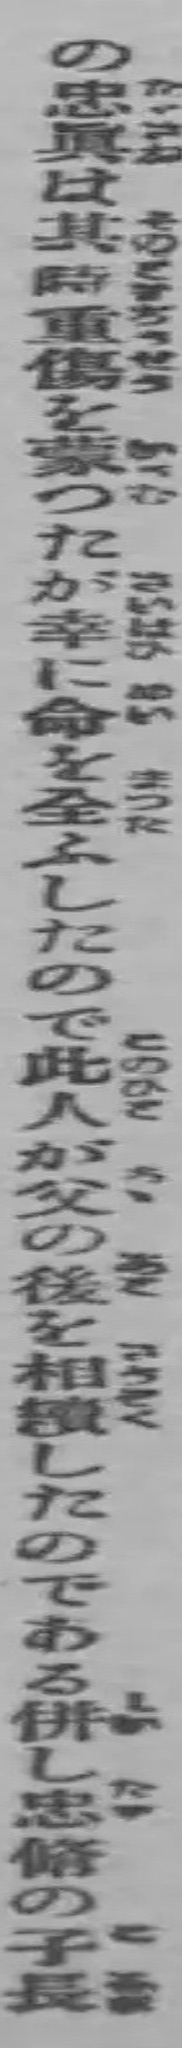の忠真は其時重傷を蒙つたが幸に命を全ふしたので此人が父の後を相続したのである併し忠脩の子長
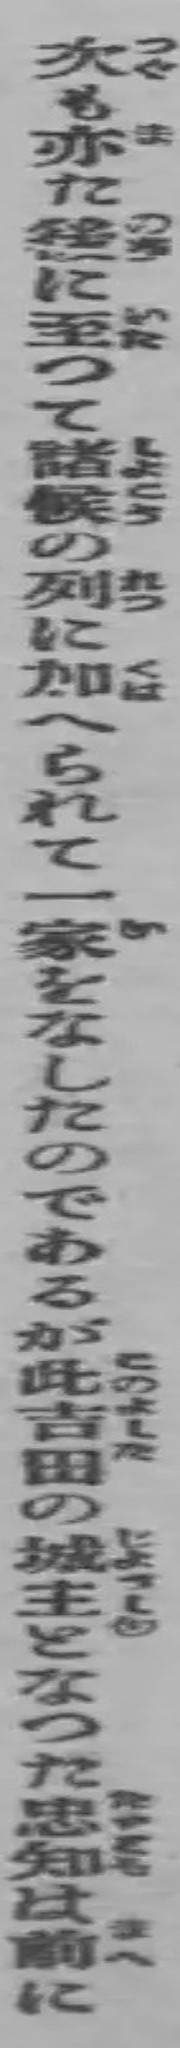次も亦た後に至つて諸侯の列に加へられて一家をなしたのであるが此吉田の城主となつた忠知は前に
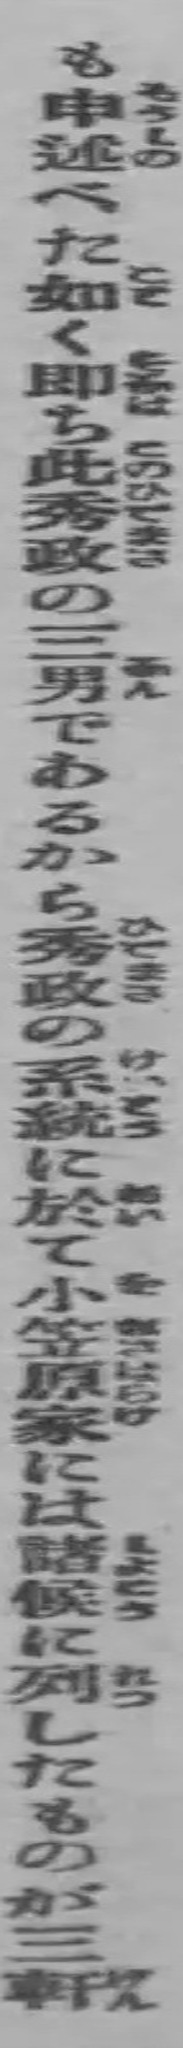も申述べた如く即ち此秀政の三男であるから秀政の系統に於て小笠原家には諸侯に列したものが三軒
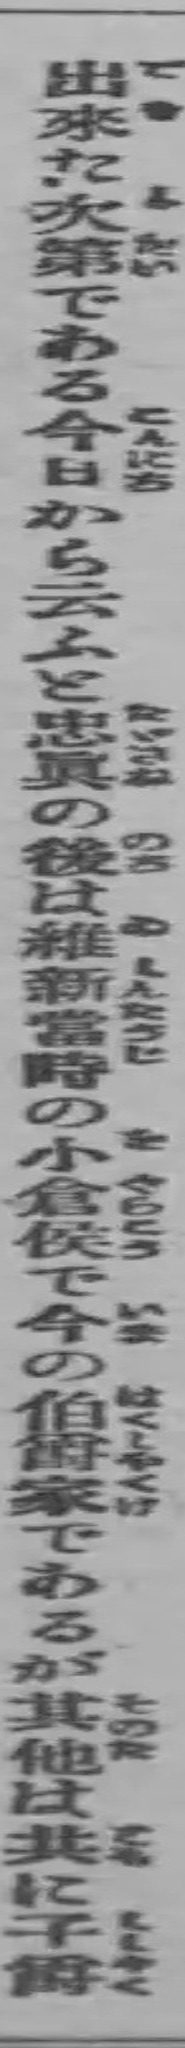出来た次第である今日から云ふと忠真の後は維新当時の小倉侯で今の伯爵家であるが其他は共に子爵
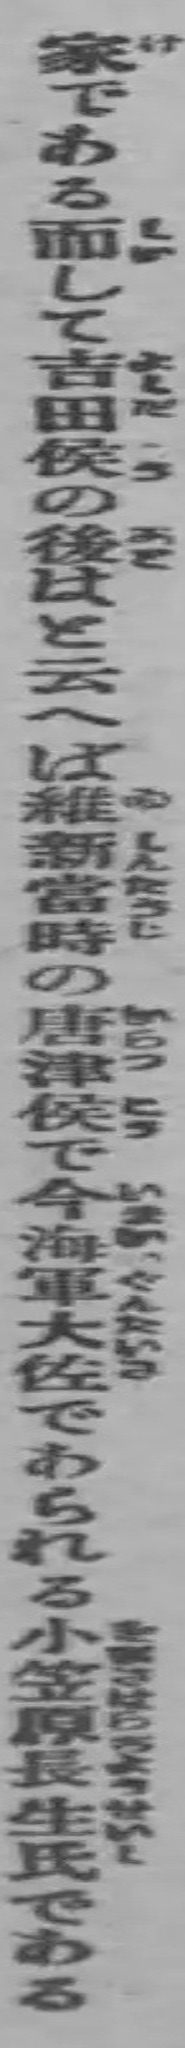家である而して吉田侯の後はと云へば維新当時の唐津侯で今海軍大佐であられる小笠原長生氏である
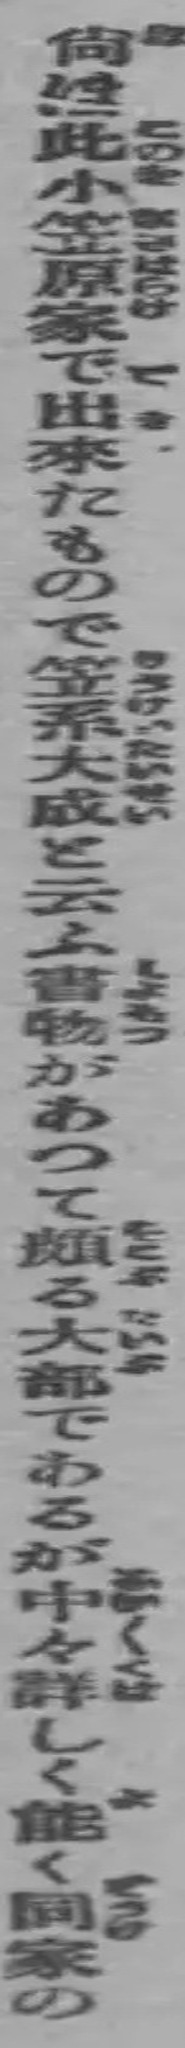尚ほ此小笠原家で出来たもので笠系大成と云ふ書物があつて頗る大部であるが中々詳しく能く同家の

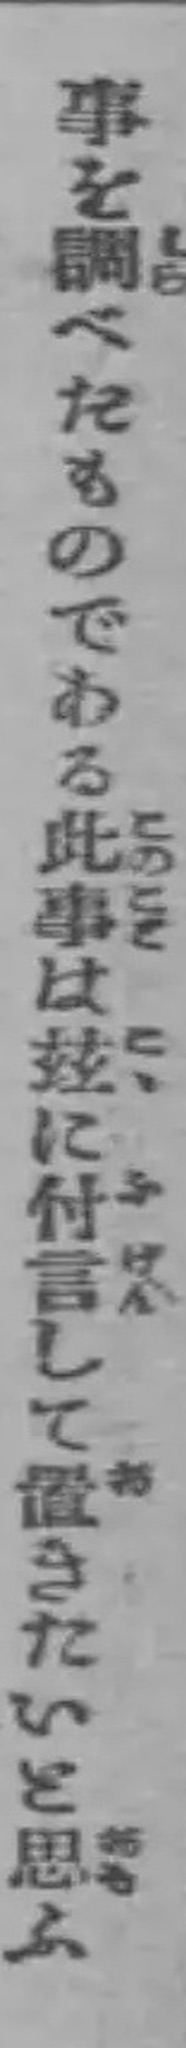事を調べたものである此事は茲に付言して置きたいと思ふ
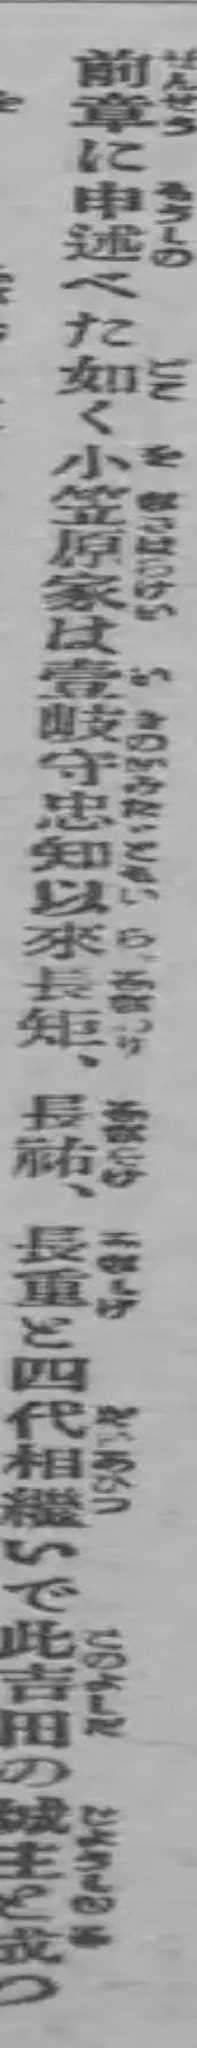前章に申述べた如く小笠原家は壱岐守忠知以来長矩、長祐、長重と四代相継いで此吉田の城主と成つ
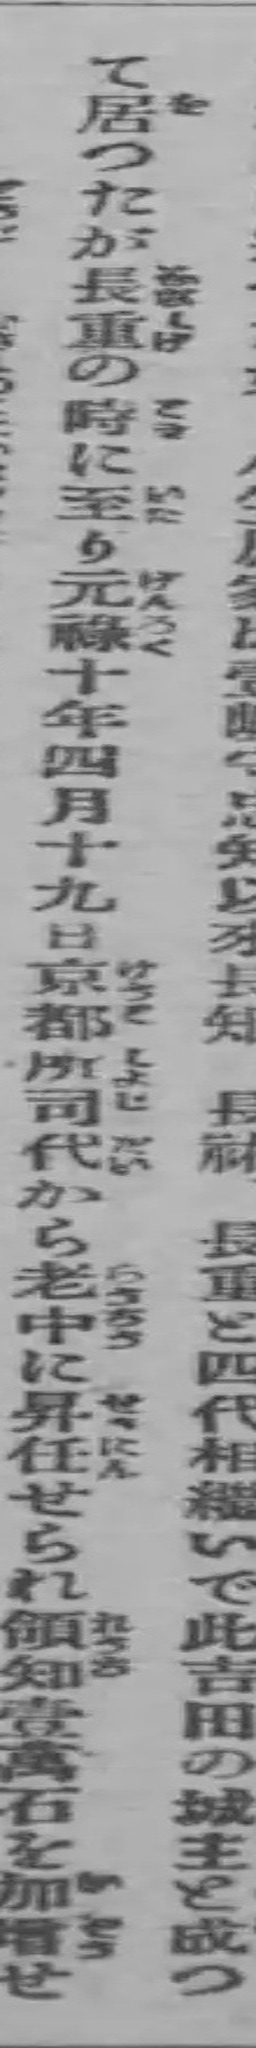て居つたが長重の時に至り元禄十年四月十九日京都所司代から老中に昇任せられ領地壱万石を加増せ
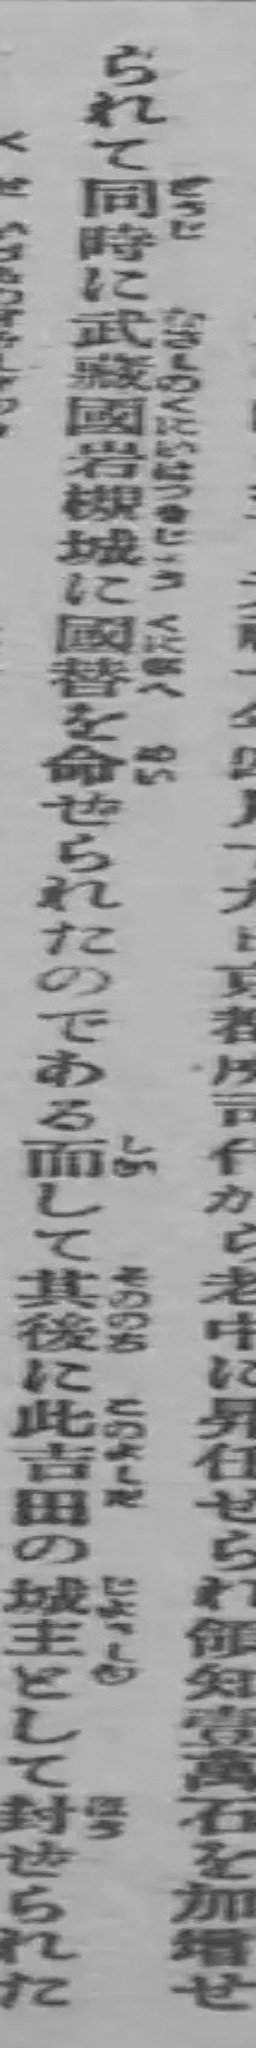られて同時に武蔵国岩槻城に国替を命ぜられたのである而して其後に此吉田の城主として封ぜられた
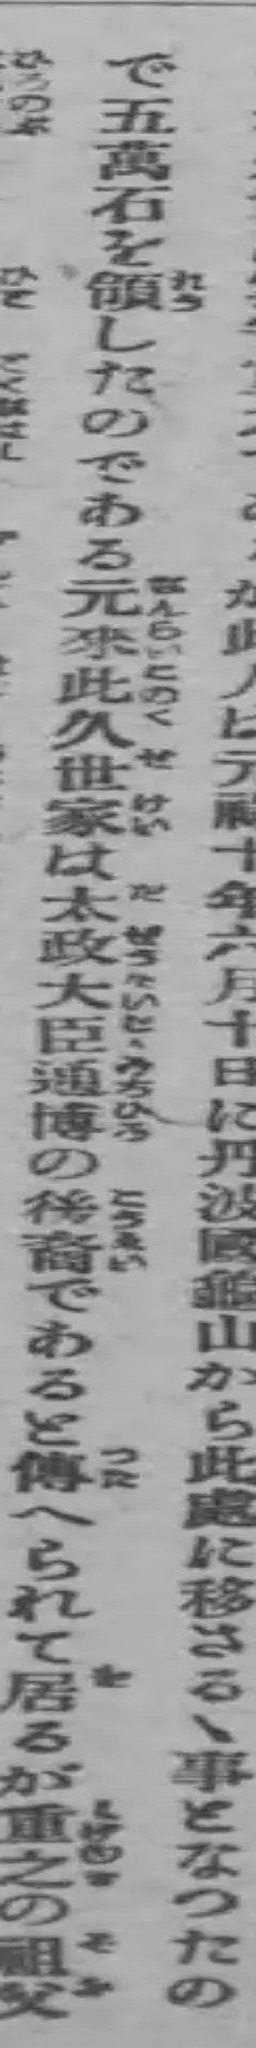久世広宣で五万石を領したのである元来此久世家は太政大臣道博の後裔であると伝へられて居るが重之の祖父
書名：豊橋市史談
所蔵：国立国会図書館 National Diet Library, JAPAN
